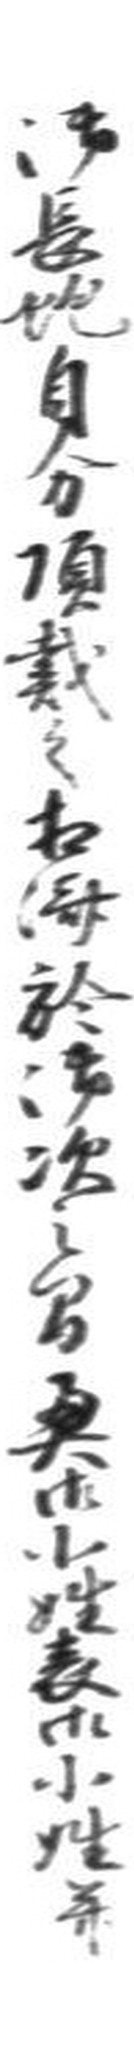御長蚫自分頂戴之相済於御次之間奥御小姓表御小姓并

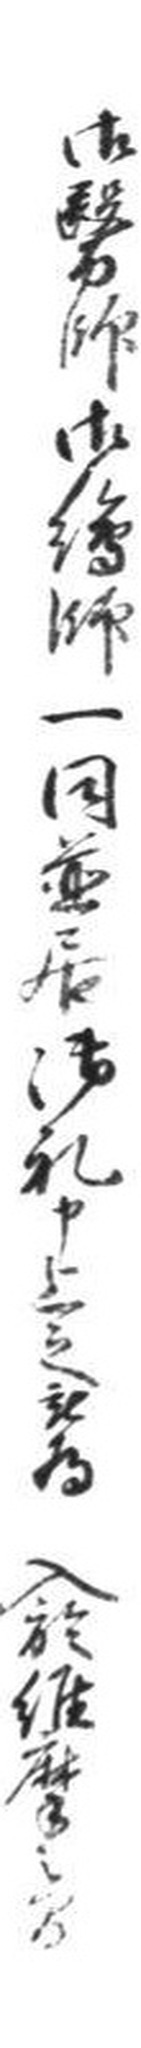御医師御絵師一同並居御礼申上之被為入於維摩之間
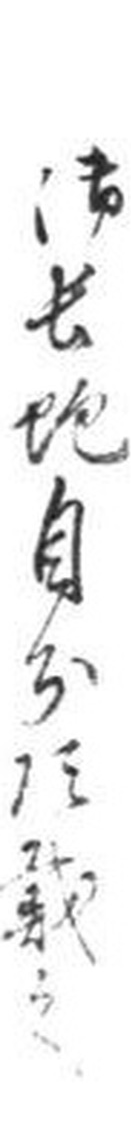御長蚫自分頂戴之
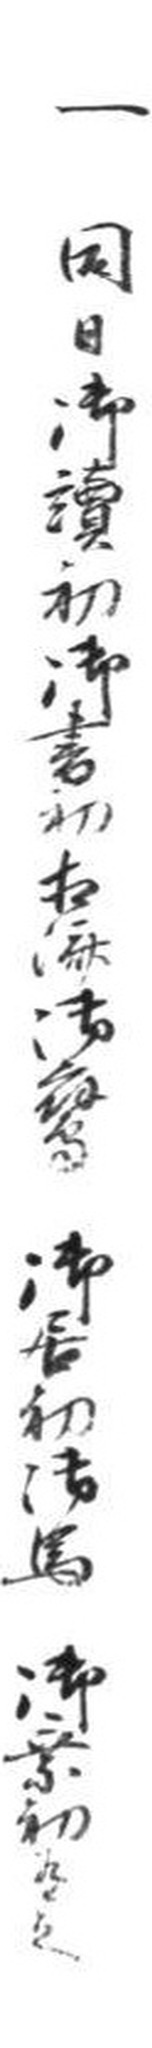一同日御読初相済御鷹御居初御馬御乗初有之
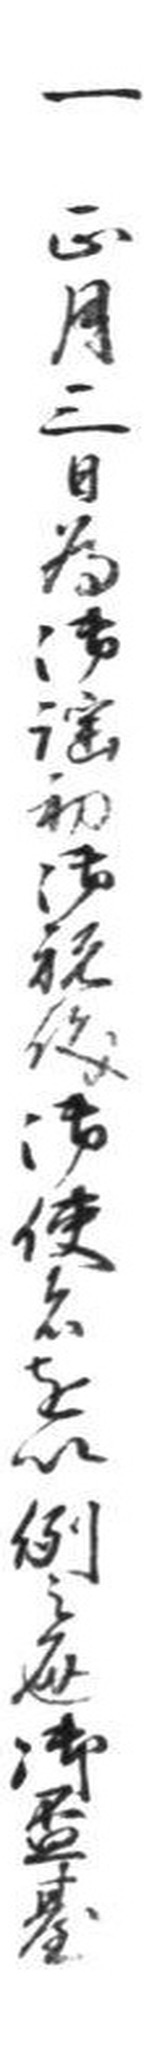一正月三日為御謡初御祝儀御使者を以例之通御盃台
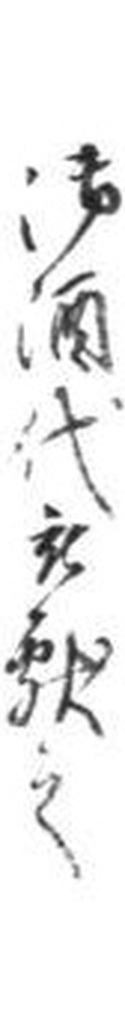御酒代被献之
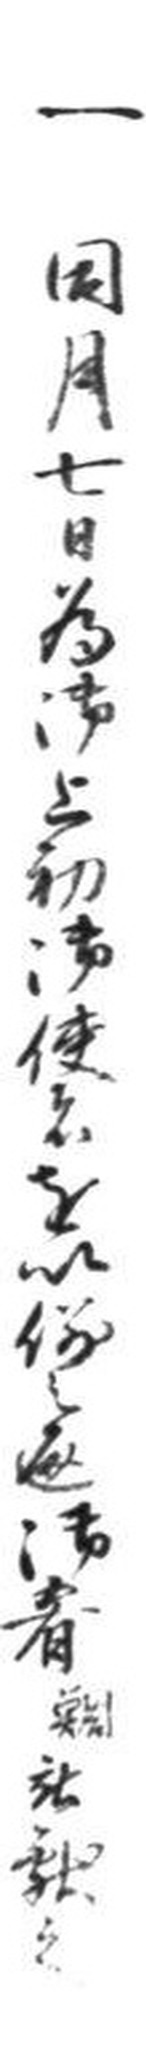一同月七日為御上初御使者を以例之通御肴鯛被献之
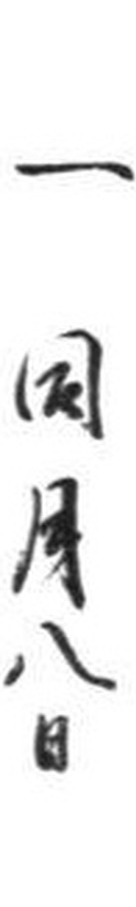一同月八日
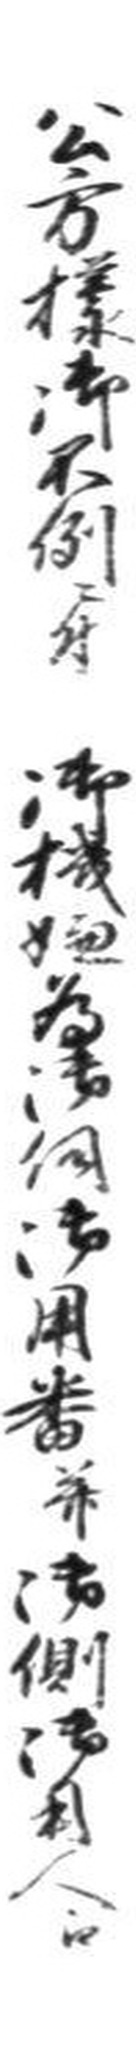公方様御不例ニ付御機嫌為御伺御用番并御側御用人江
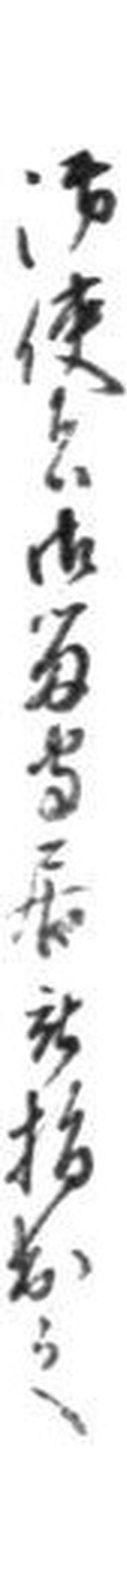御使者御留守居被指出之
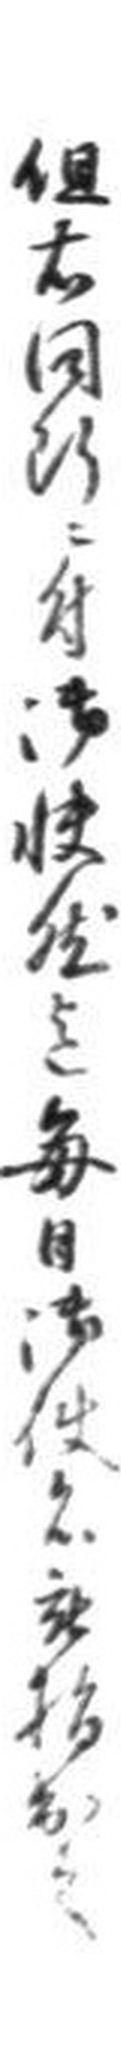但右同断ニ付御快然迄毎日御使者被指出之
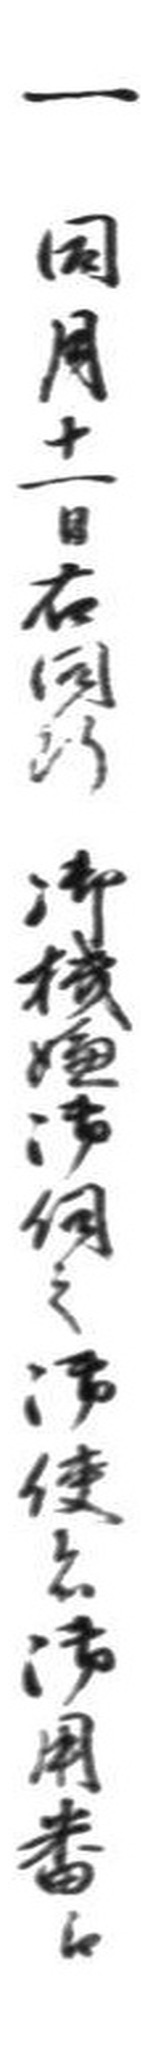一同月十一日右同断御機嫌御伺之御使者御用番江
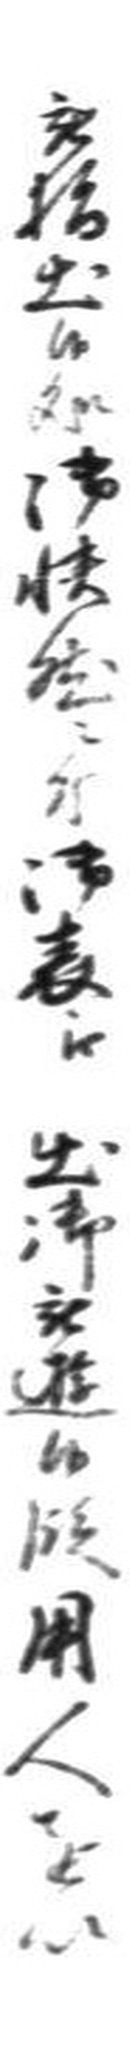被指出候処御快然ニ付御表江出御被遊候段用人を以
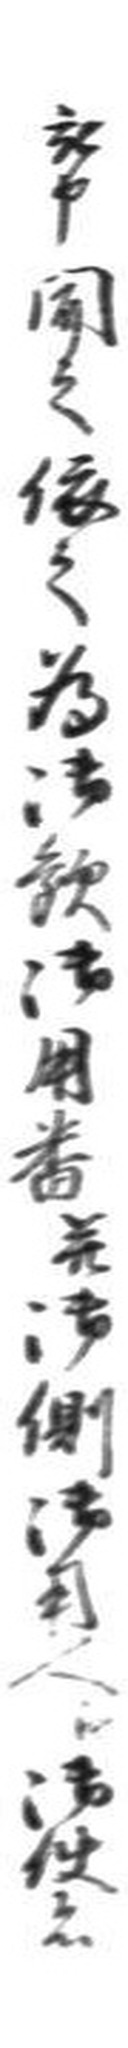被申聞之依之為御歓御用番并御側御用人江御使者
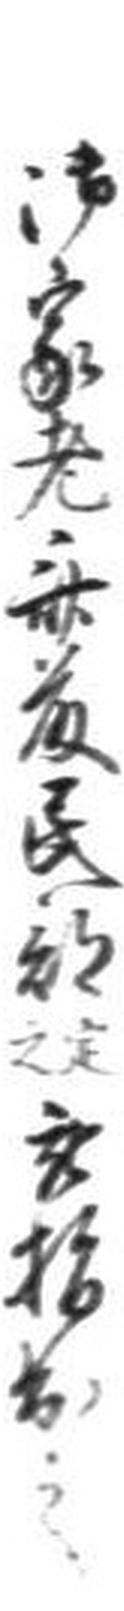御家老斎藤民部定之被指出之
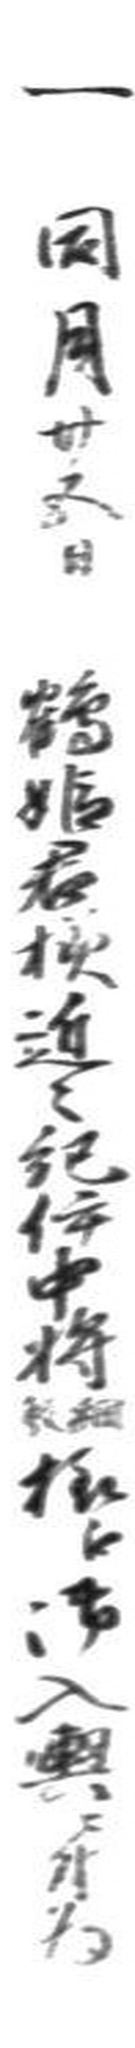一同月廿五日鶴姫君様近々紀伊中将綱教様江
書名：家譜 十五 綱昌公 従天和元年到元禄十二年
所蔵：福井県文書館 Fukui Prefectural Archives
